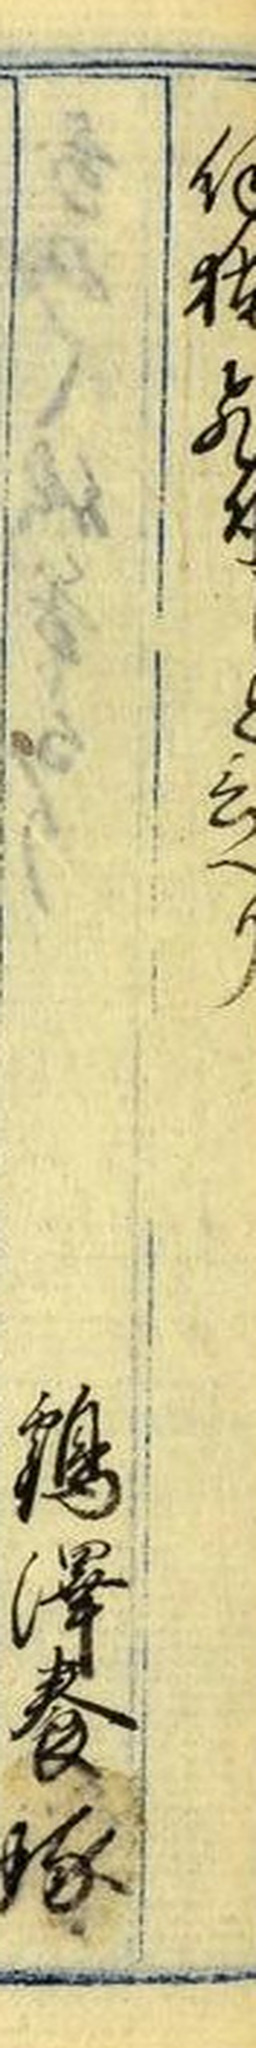鶴沢養琢
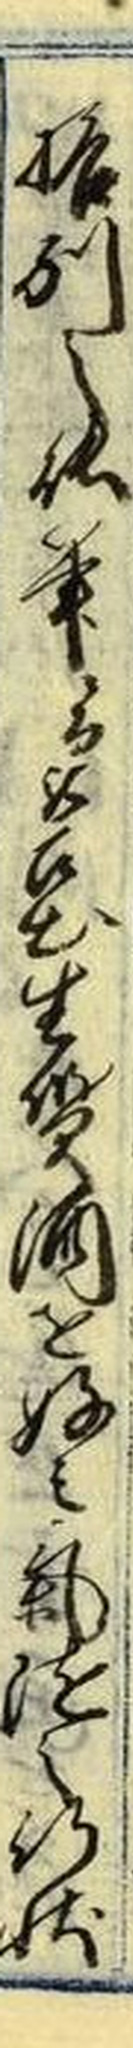格別之能筆に而被召出生質酒を好み気随之行状
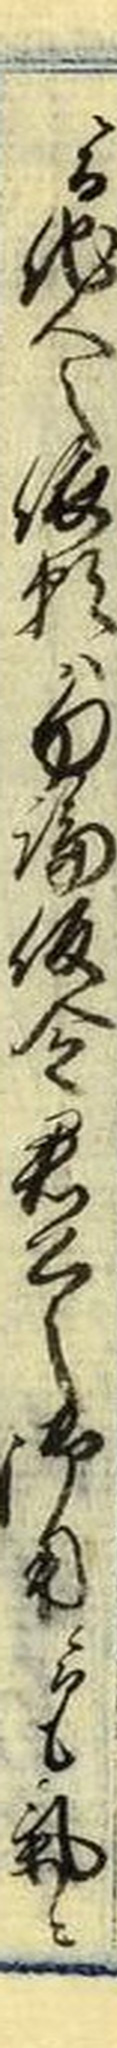に而他人之依頼は勿論仮令君公之御用に而も気に
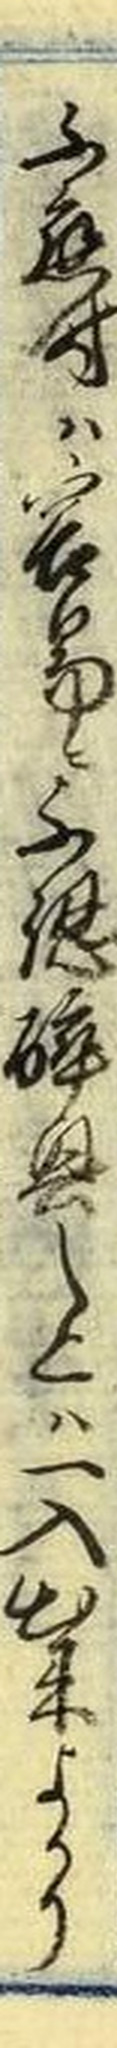不応時は容易に不認酔興之上は一入出来よかり
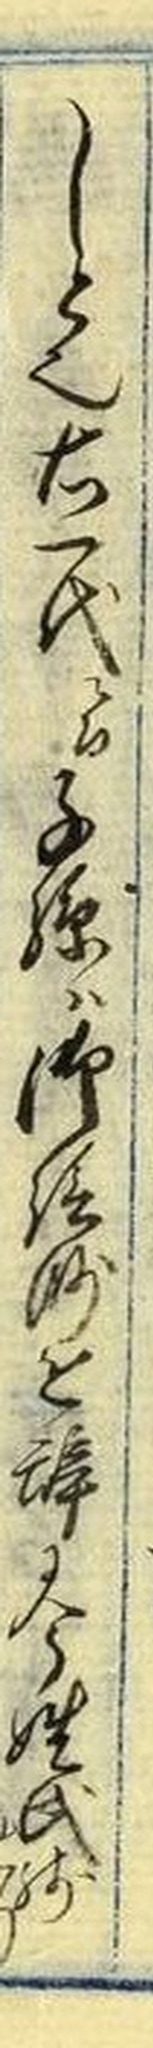しと也右一代に而子孫は御絵師を辞于今姓氏残れり
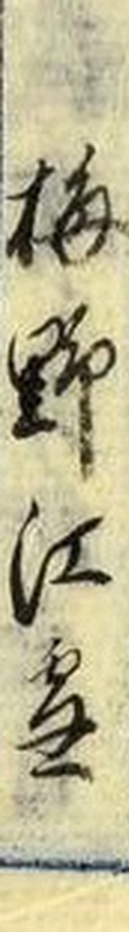梅野江雪
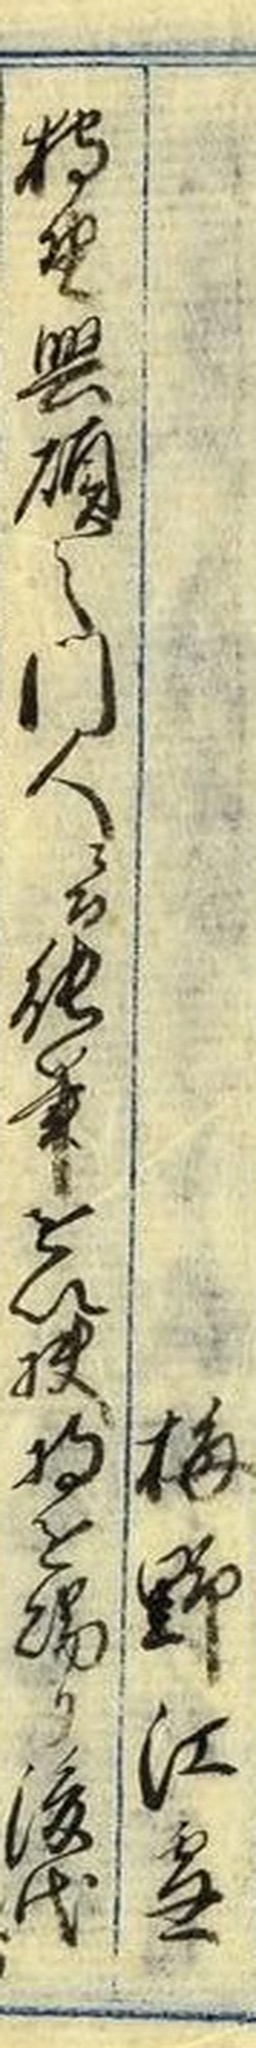狩野興碩之門人に而能筆を以扶持を賜り後代ゟ
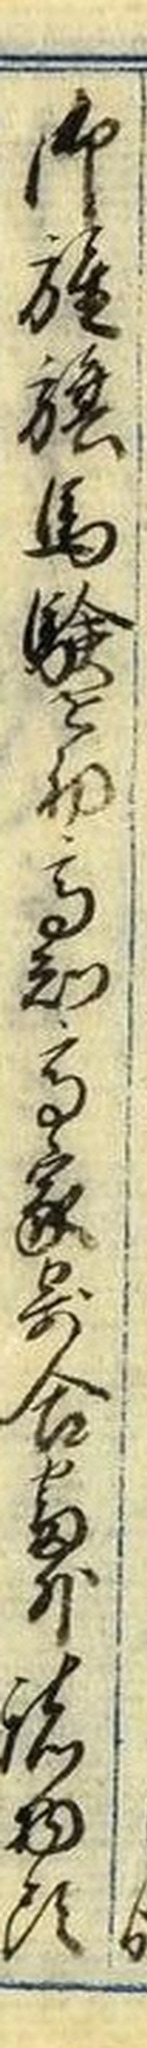御旌旗馬験を初高知高家寄合番外諸物頭
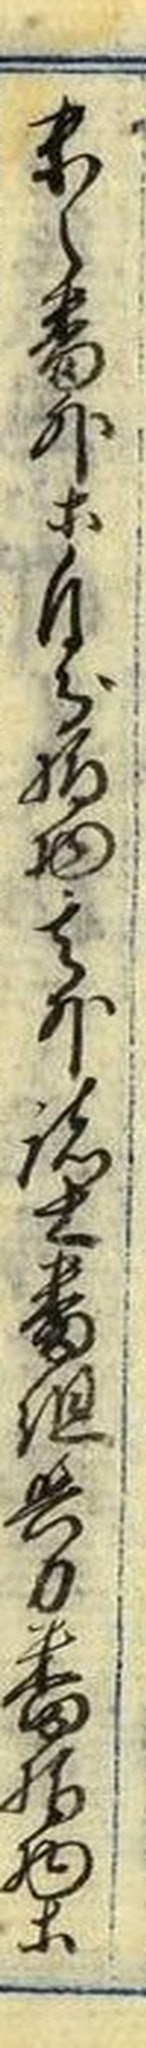末之番外等自分指物其外諸士番組与力番指物等

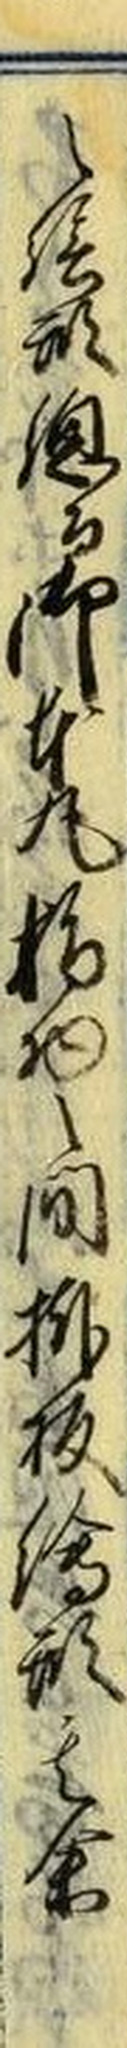之絵形総而本丸指物之間柳板絵形其余
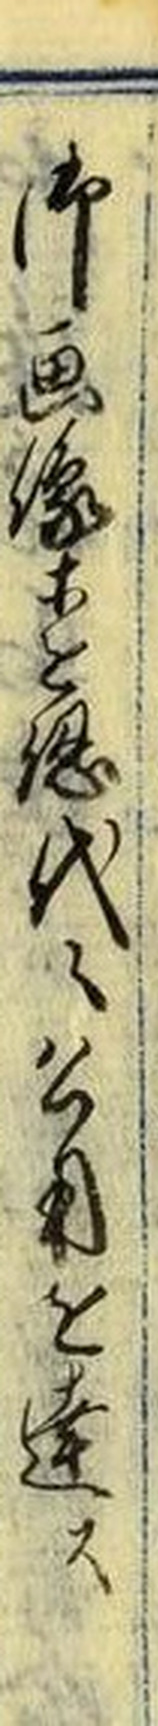御画像等を認代々公用を達す
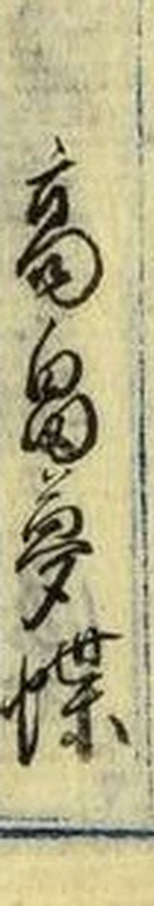高畠夢蝶
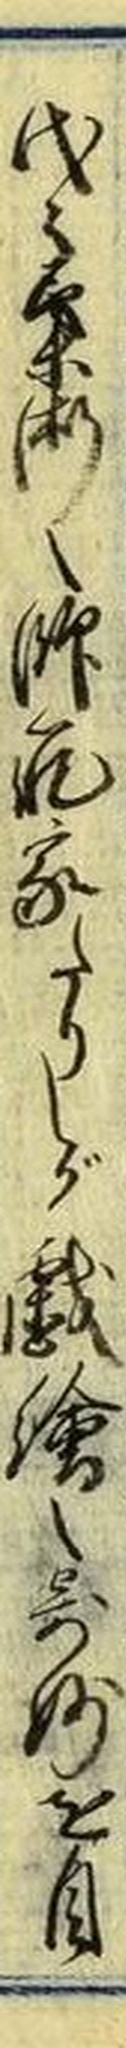代々柔術之師範家たりしが戯絵之奇妙を自
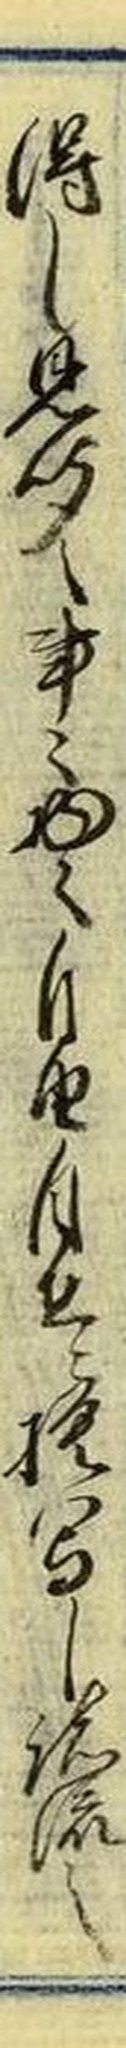得し見聞之事々物々自由自在に模写し諸流之
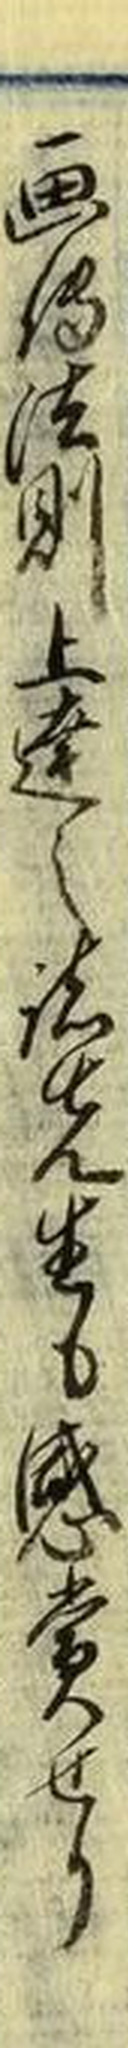画伝法則上達之諸先生も感賞せり
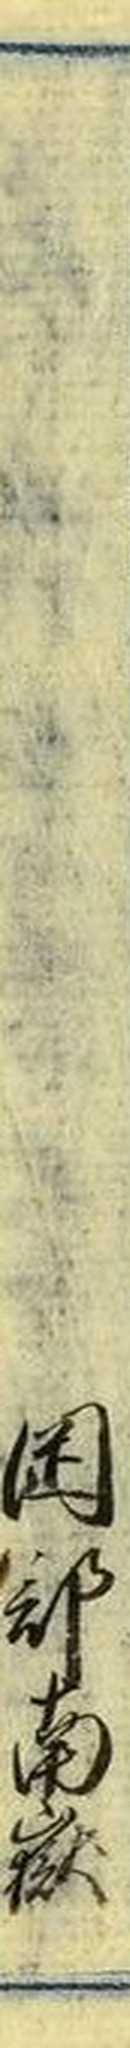岡部南嶽
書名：温古集 四巻
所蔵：福井県文書館 Fukui Prefectural Archives
